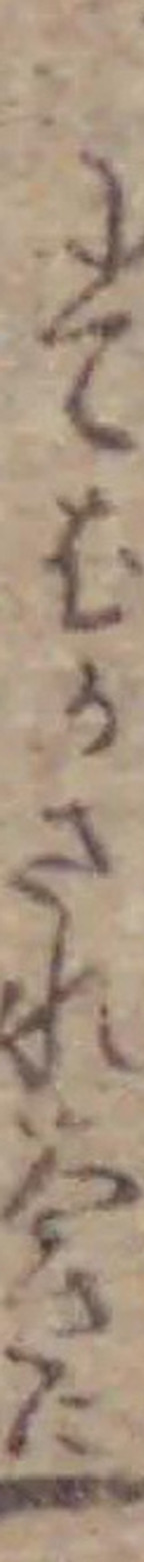にてはかされ大きに
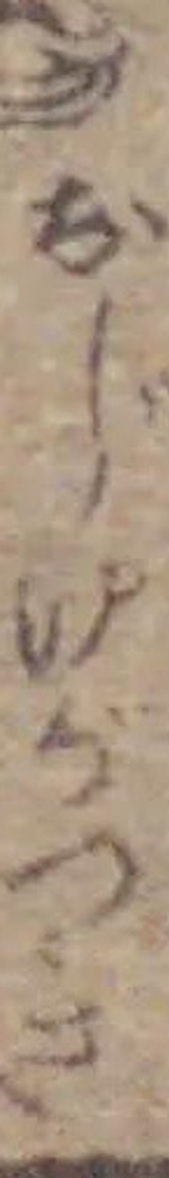おじけがつき
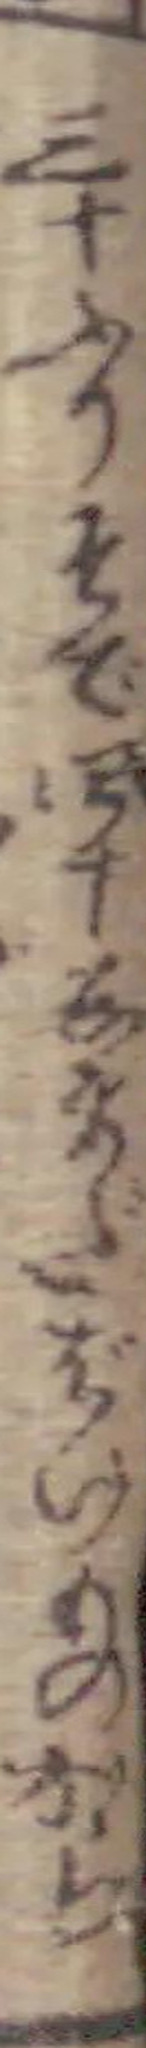三十ふりそで四十しまだばけものから
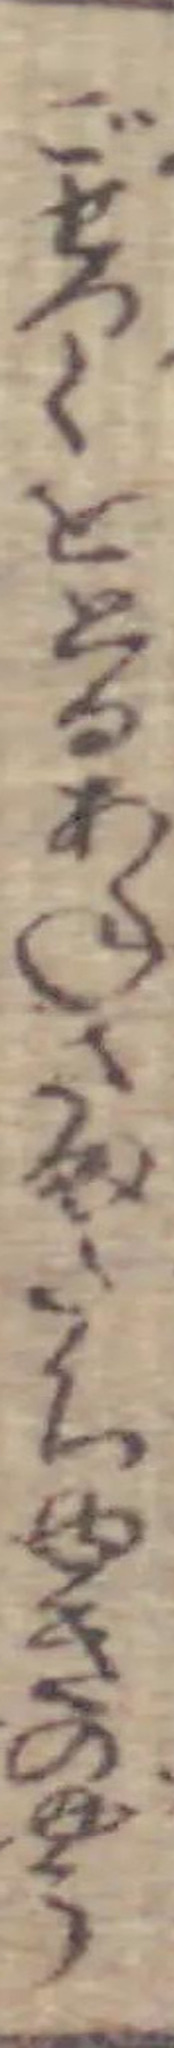ごせつくをとるあねさまたちゆきのやう
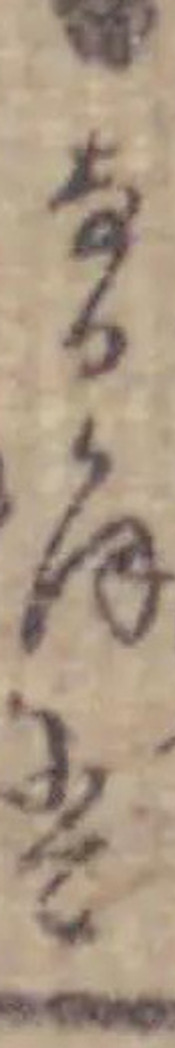なるかほにて
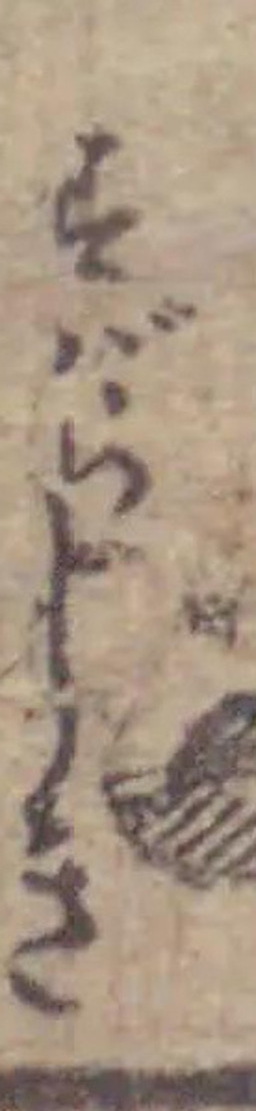すばらしき
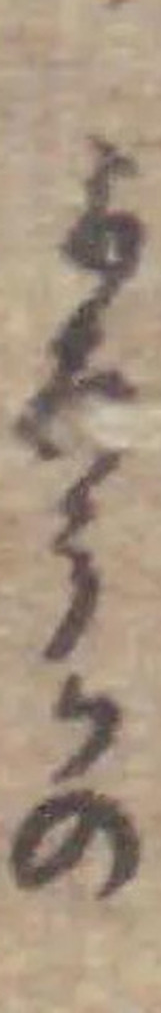よろうかの
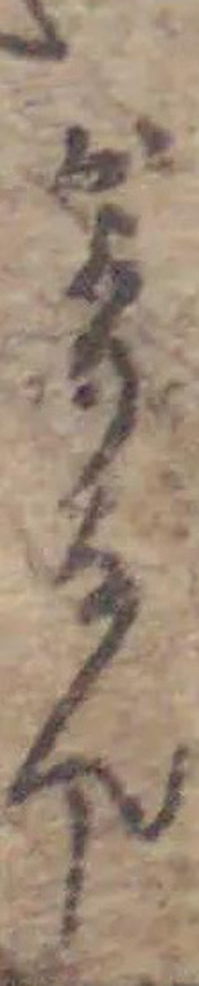およりなんし

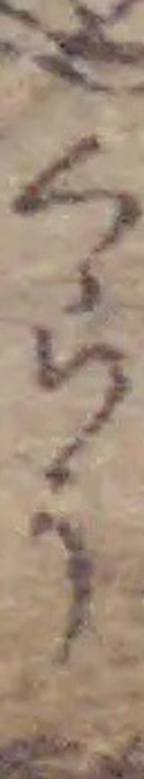くらう
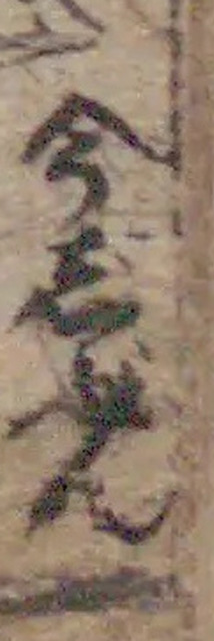今じぶん
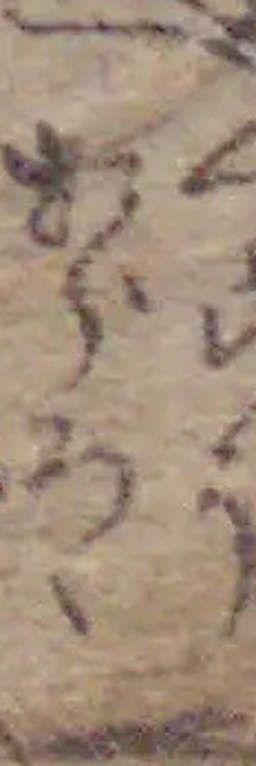物らろく
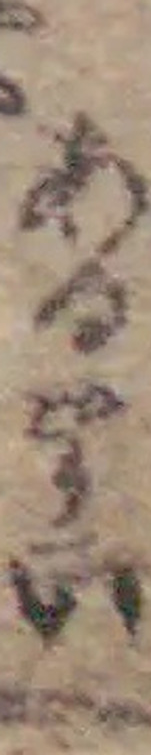あるまい
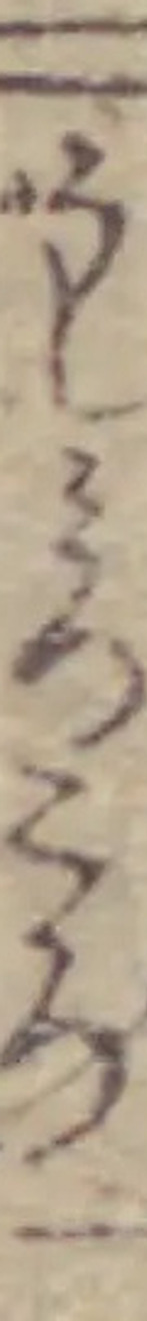うしみつころ
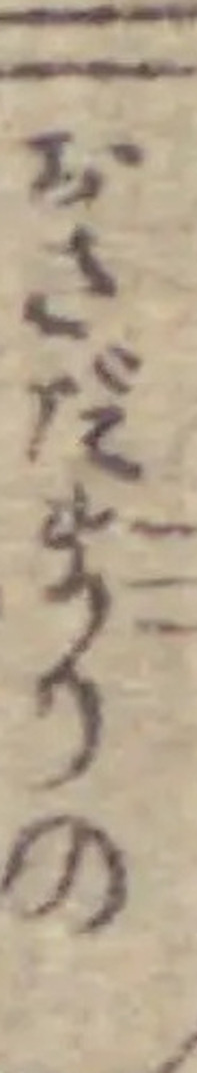おさだまりの
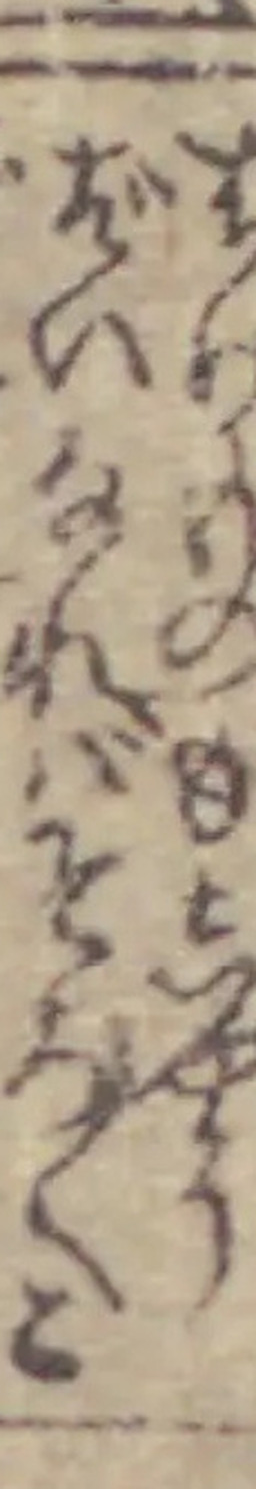ばいなればそろ〳〵と
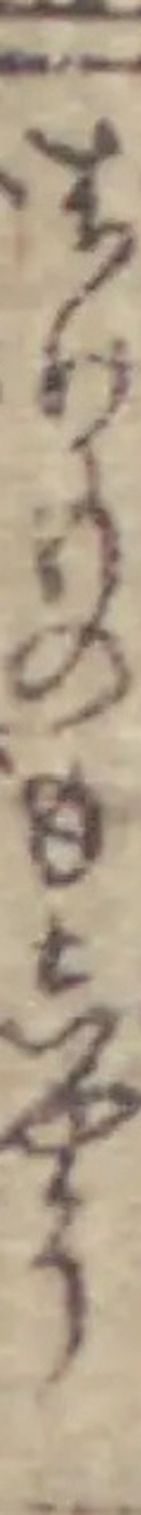ばけものもしやう
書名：化物箱根先 2巻
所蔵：国立国会図書館 National Diet Library, JAPAN
